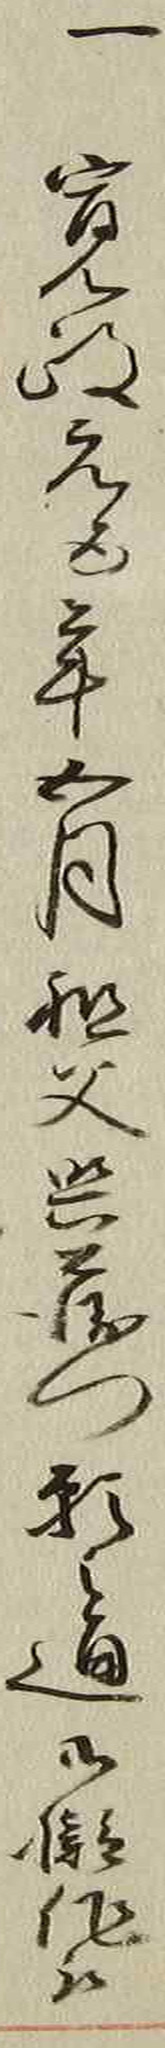一寛政元酉年五月祖父與右衛門願之通御擬作被
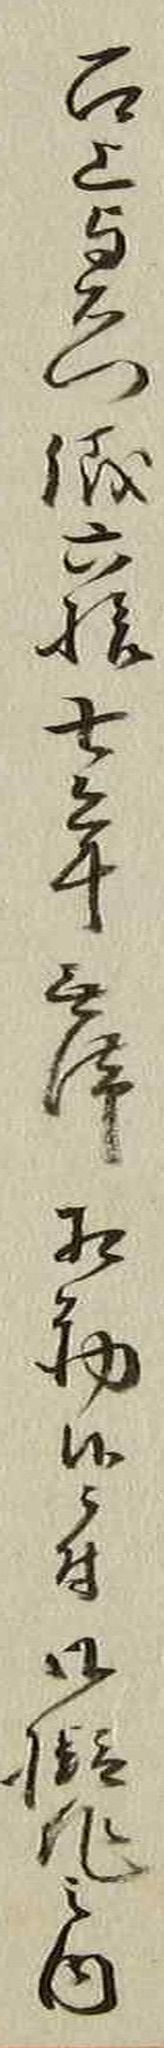召上与右門儀六拾七年無滞相勤候ニ付御擬作之内
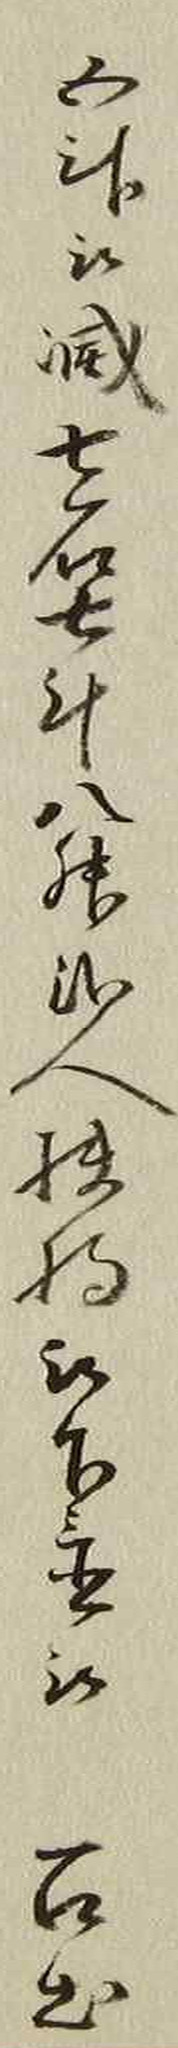五斗被減七石七斗八升弐人扶持被下置被召出
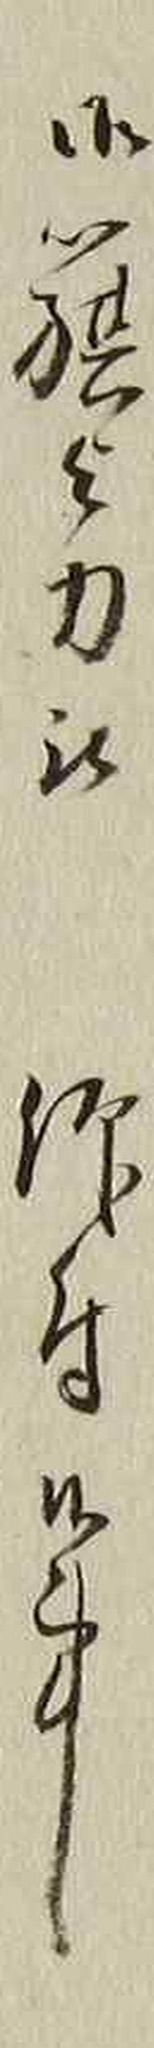御籏与力被仰付候事
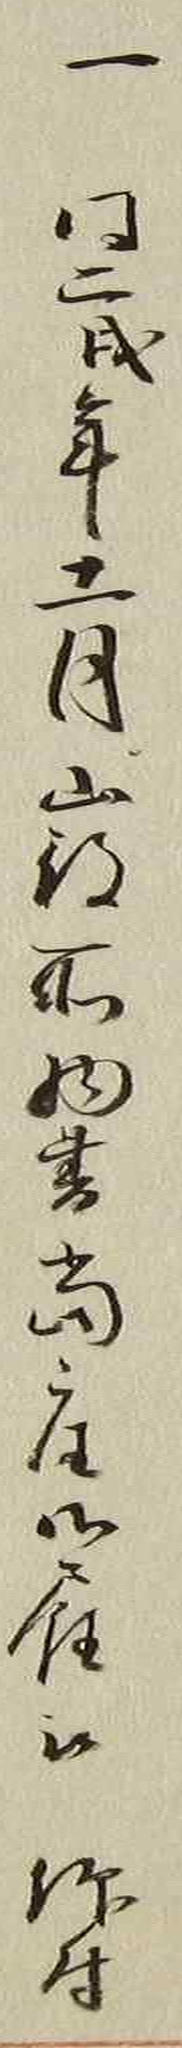一同二戌年十一月山役所物書当座御雇被仰付
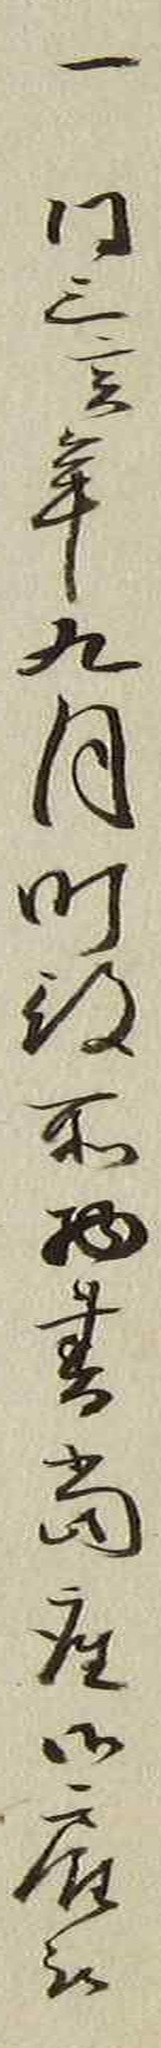一同三亥年九月町役所物書当座御雇被
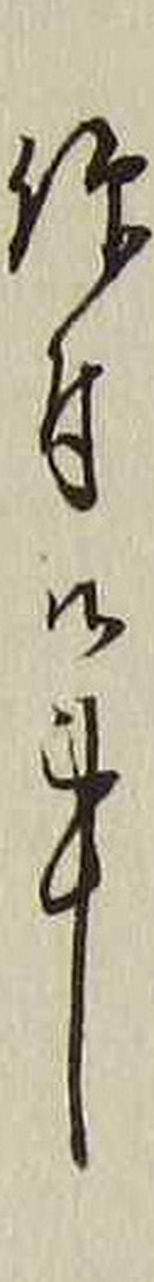仰付候事
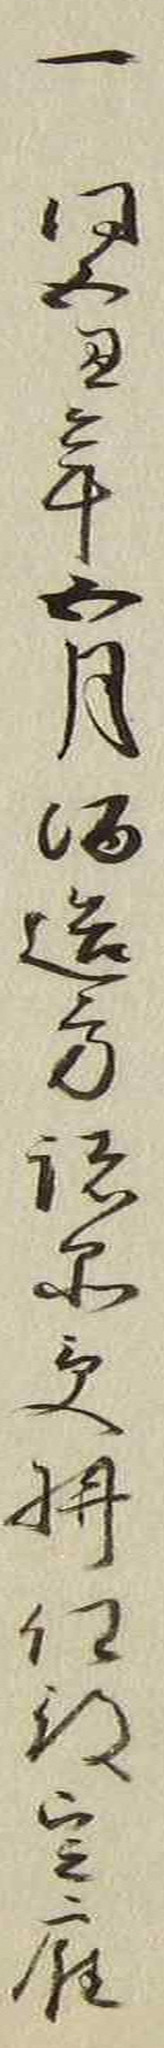一同五丑年五月酒造方諸品受払任役定雇
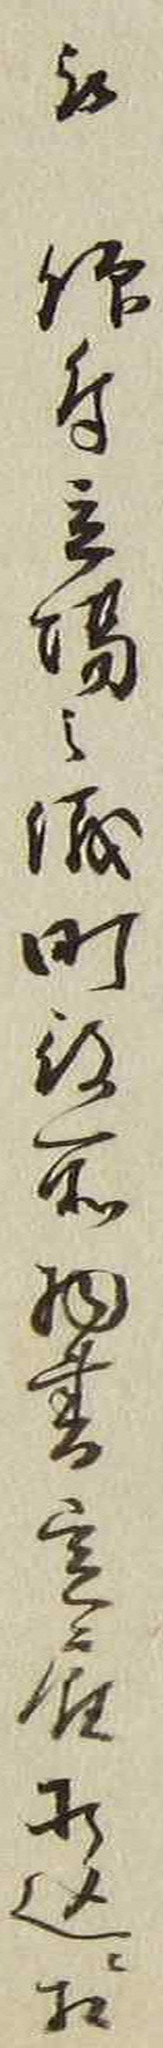被仰付立場之儀町役所物書定雇打込ニ相

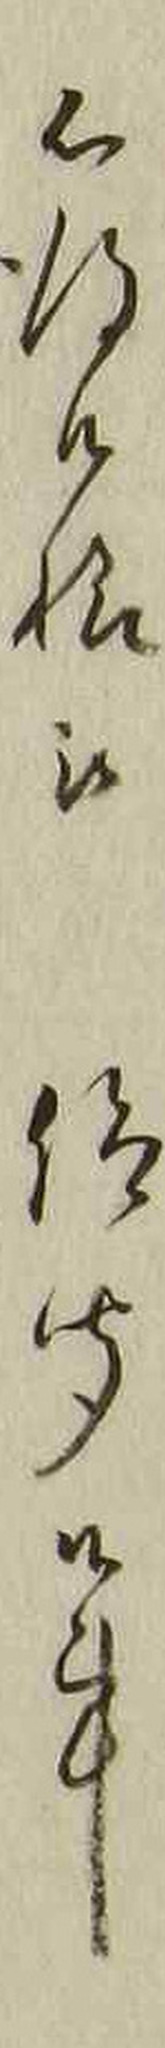心得候様被仰聞候事
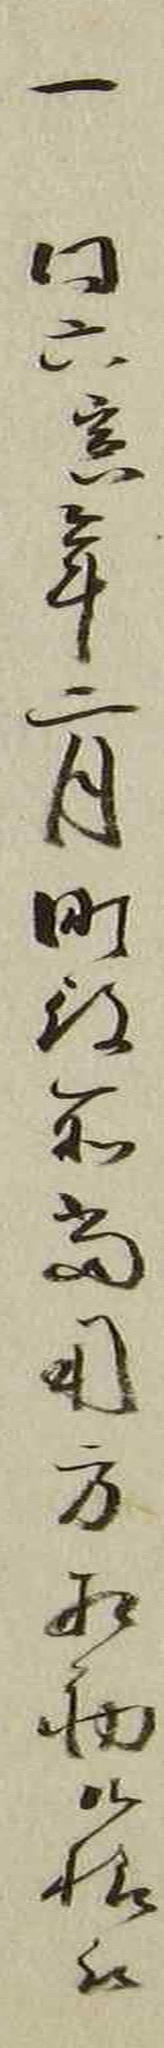一同六寅年二月町役所当用方相勤候様被
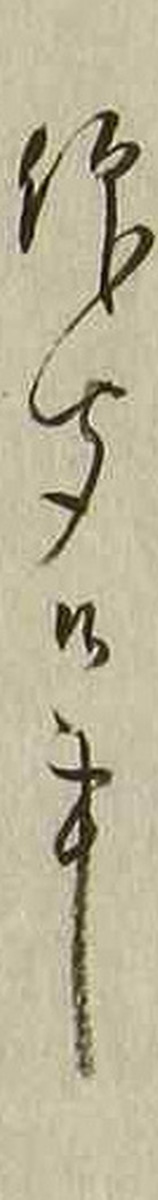仰聞候事
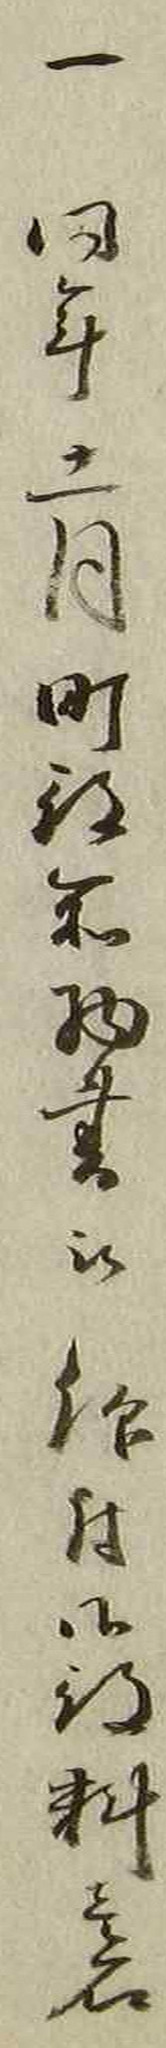一同年十一月町役所物書被仰付御役料壱石
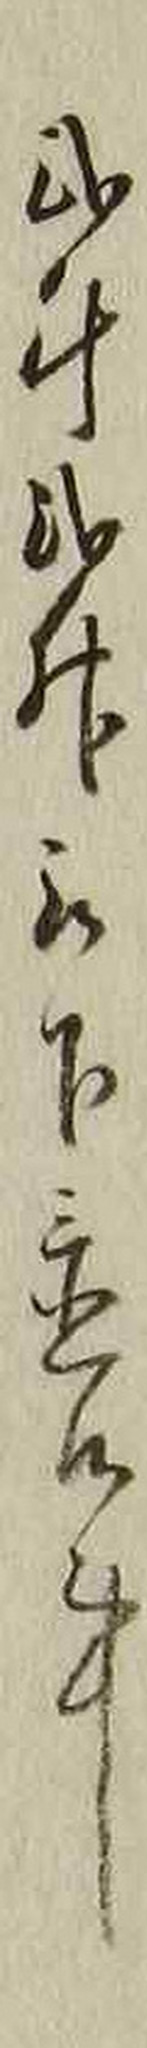弐斗弐升被下置候事
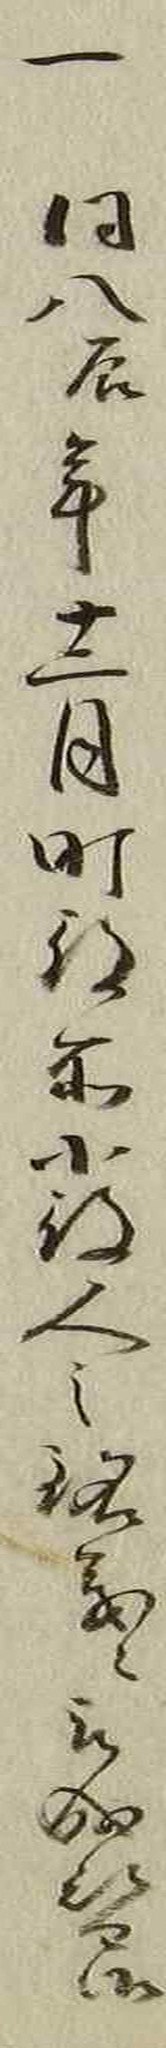一同八辰年十二月町役所小役人之銘義ニ被成替御
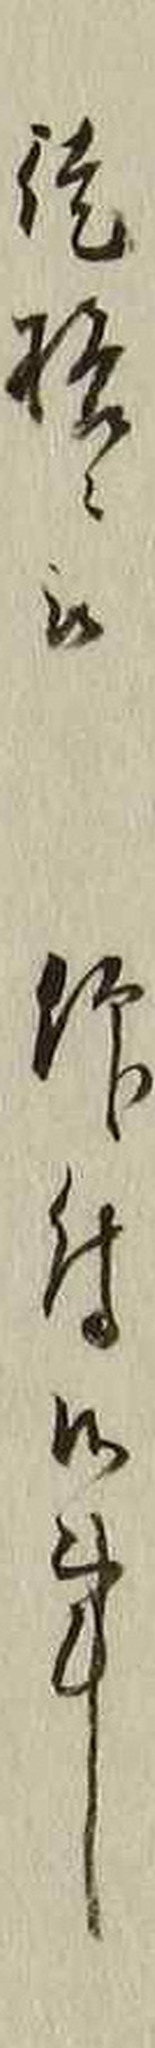徒格ニ被仰付候事
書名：諸士系譜　巻之32　い之部32
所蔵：会津若松市立会津図書館
